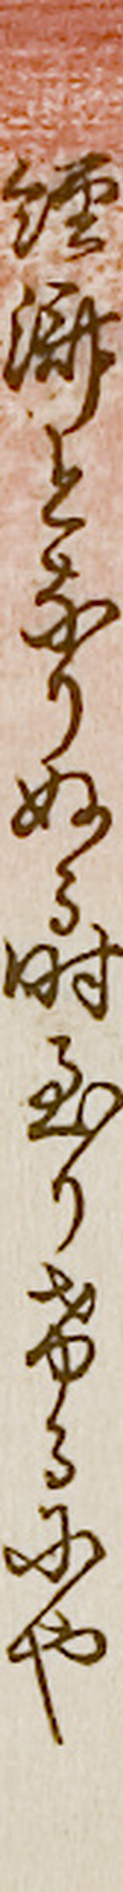経済となりぬる時至りけるにや
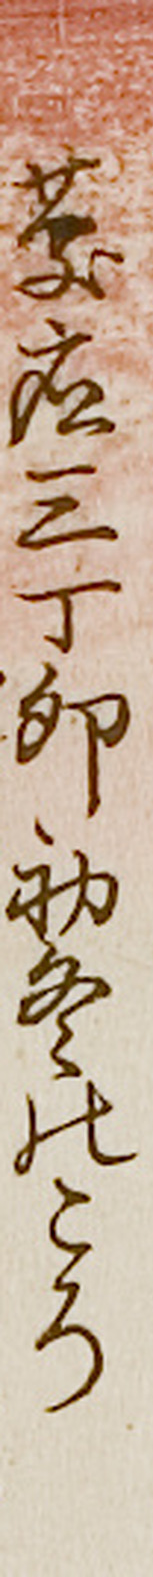慶応三丁卯初冬のころ
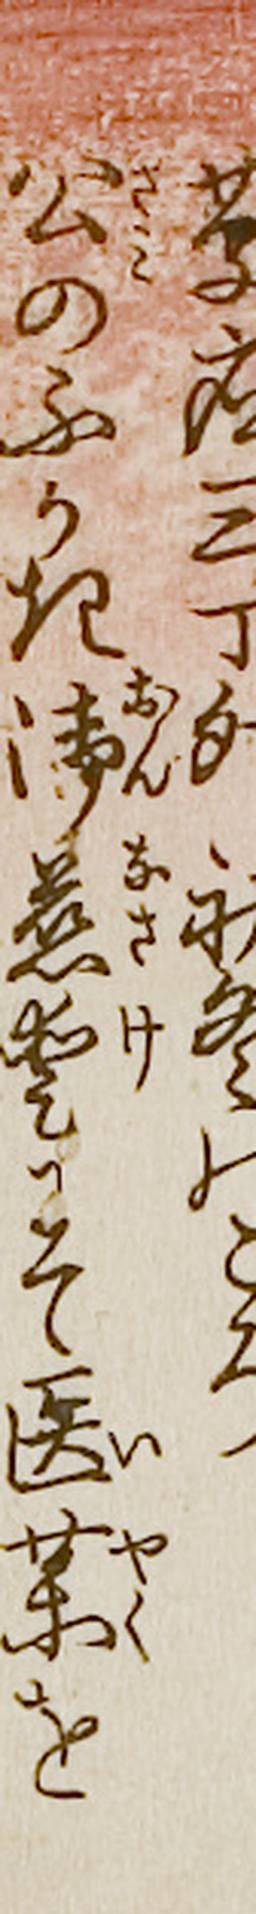公のふかき御慈悲にて医薬を
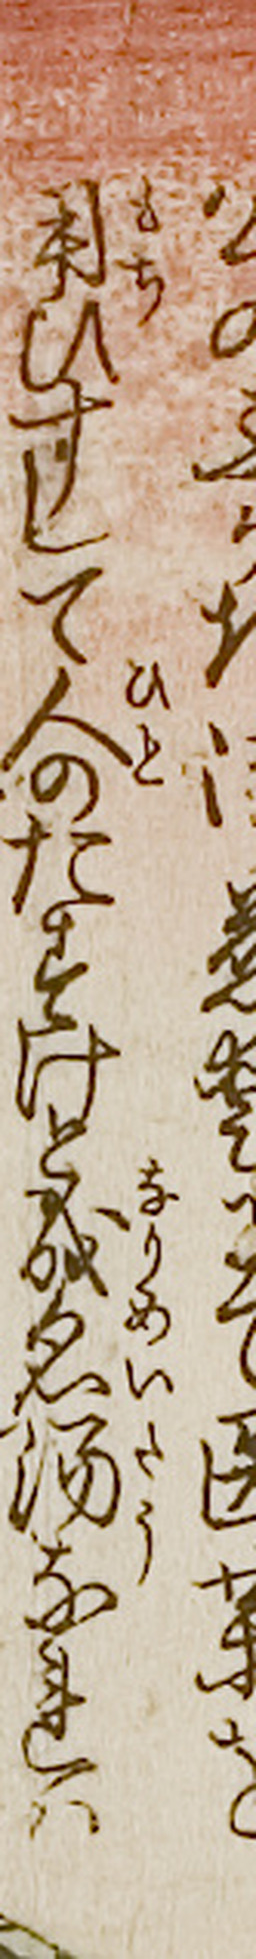用ひすして人のたすけと成名湯なれハ
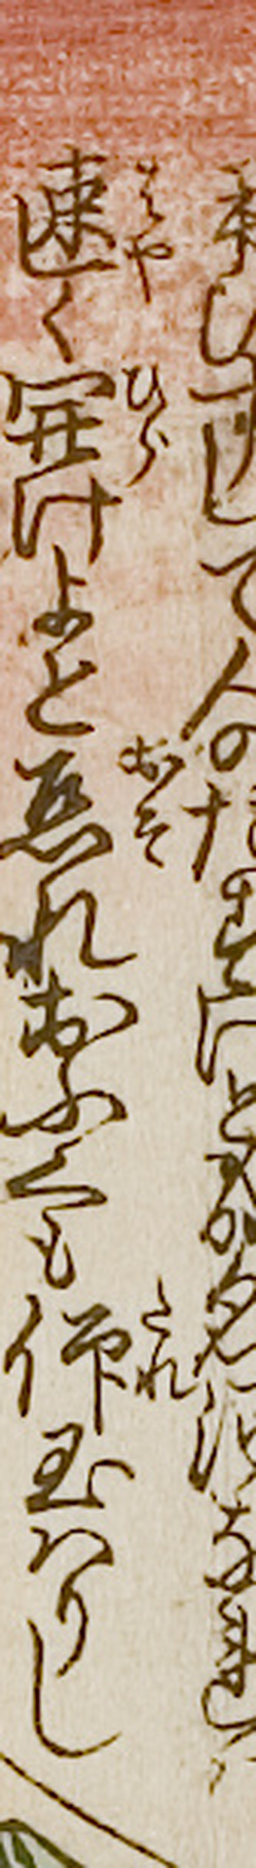速く開けよと恐れおふくも仰玉ハりし
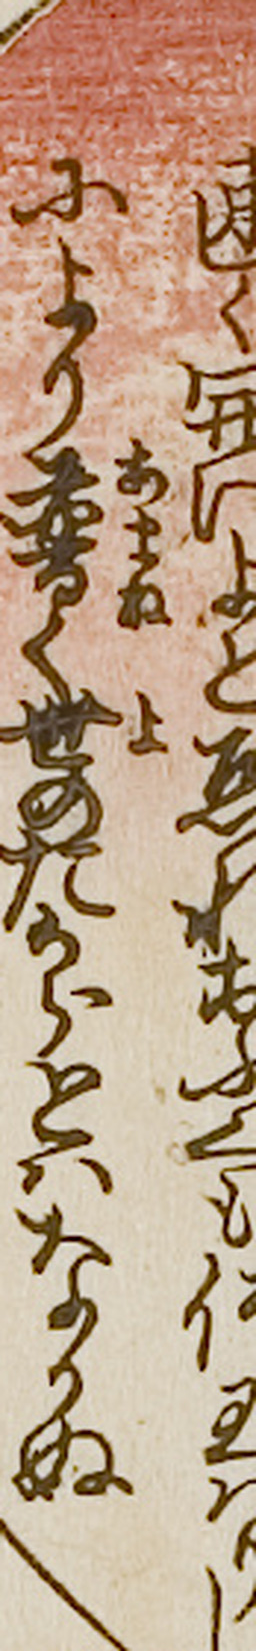により普く世のたからとハなりぬ
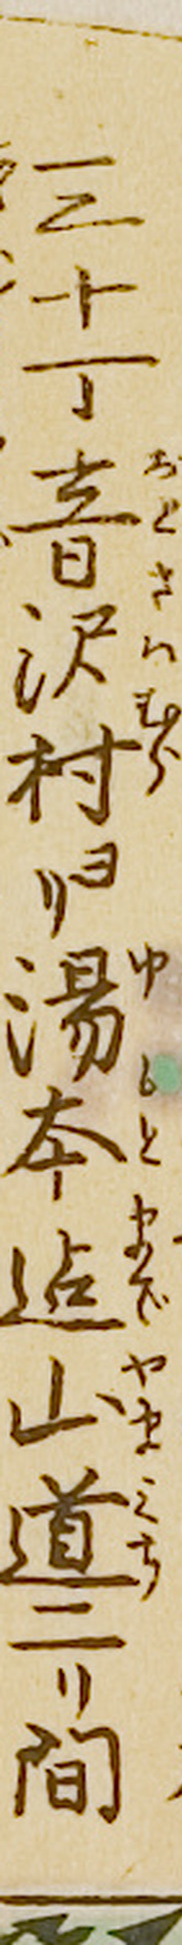三十丁音沢村ヨリ湯本迄山道二リ間
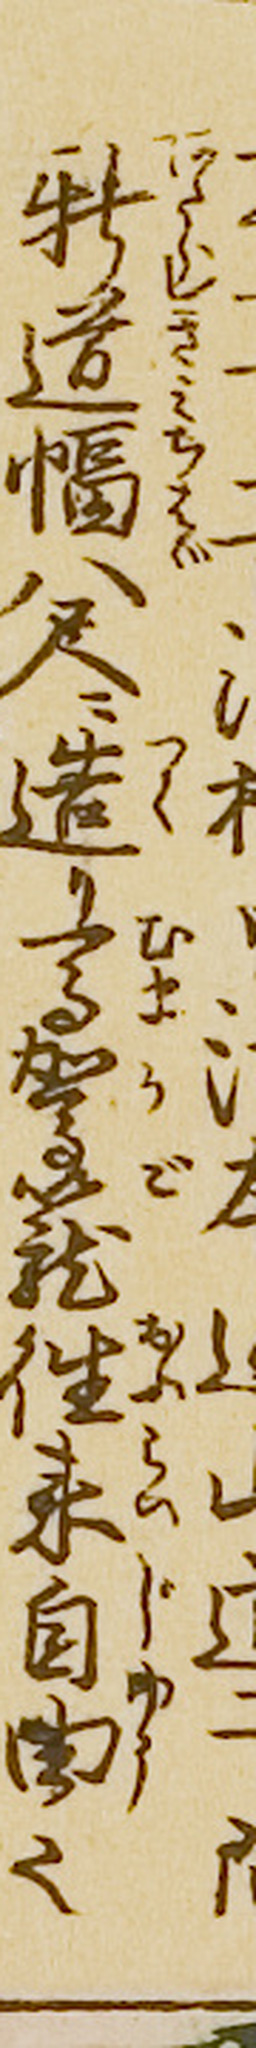新道幅八尺ニ造り馬駕籠往来自由也
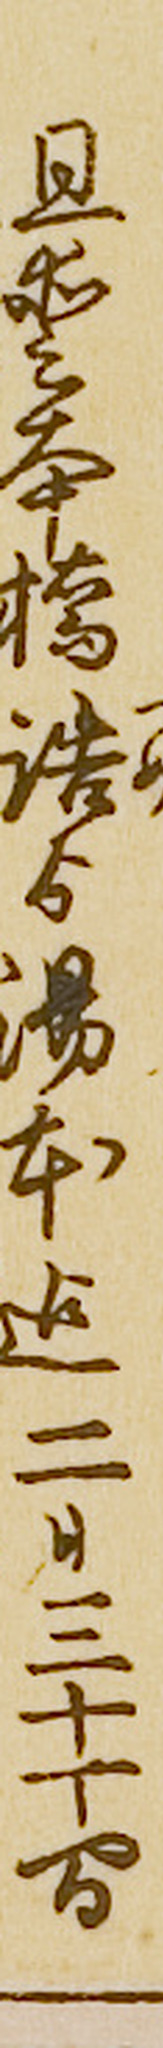且愛本橋詰ゟ湯本迄二リ三十丁間
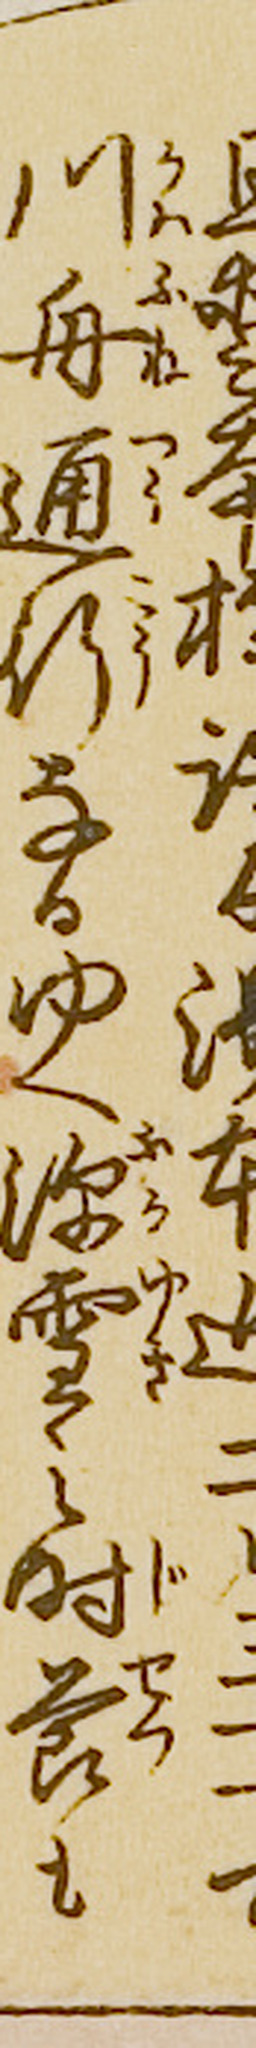川舟通行なるゆへ深雪之時節も
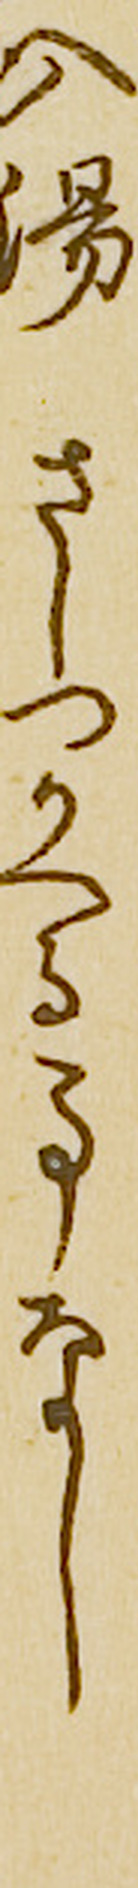入湯さしつかへる事なし
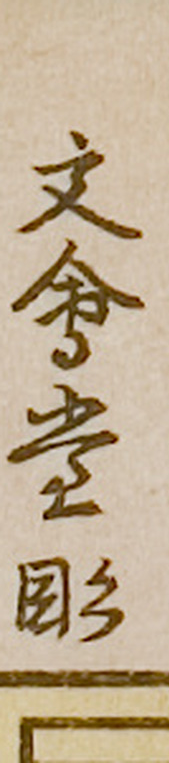文会堂彫
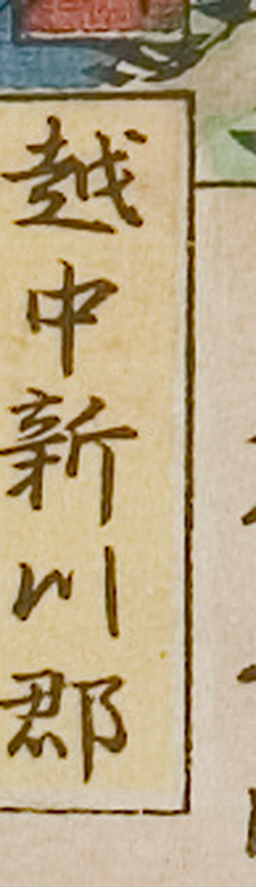越中新川郡
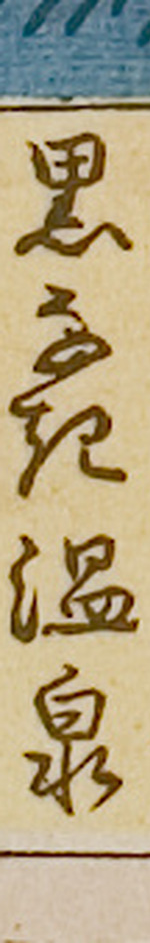黒なき温泉
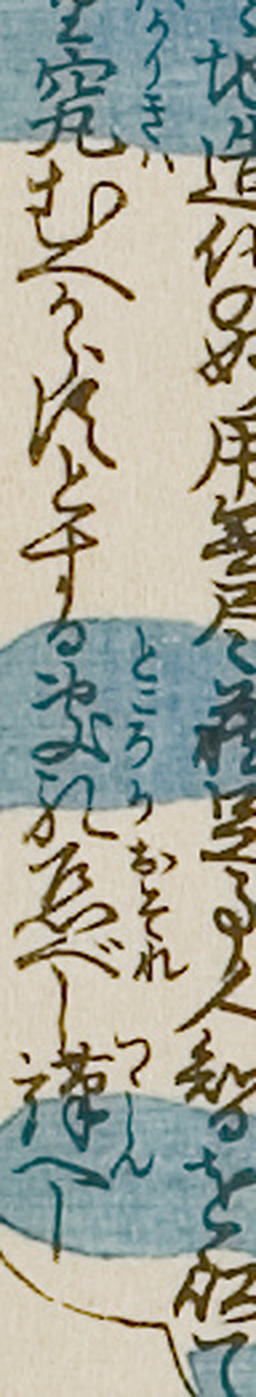全量究むへからすとする処欤恐べし謹へし
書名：[越中国新川郡黒薙温泉引札]
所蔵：東京大学総合図書館 General Library in the University of Tokyo, JAPAN
